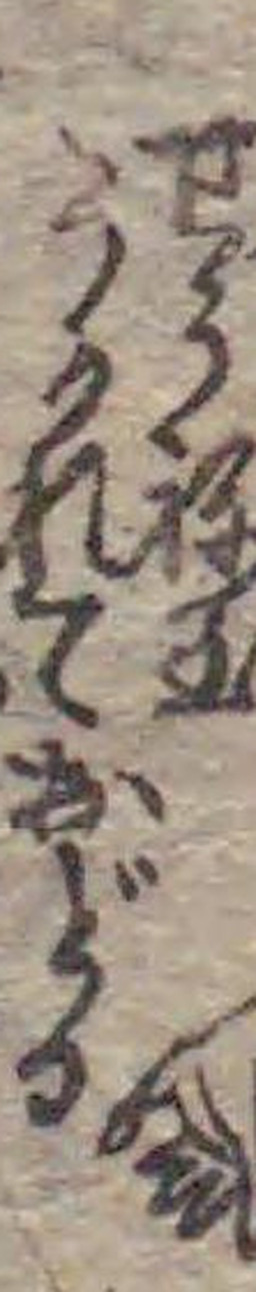うかれておどる
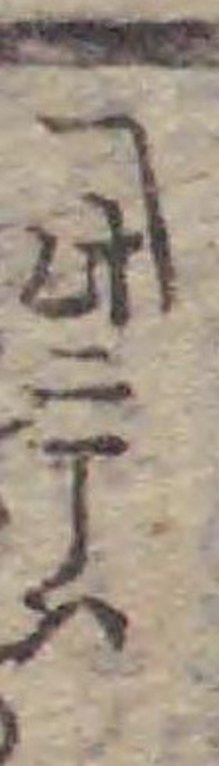〽此二丁は
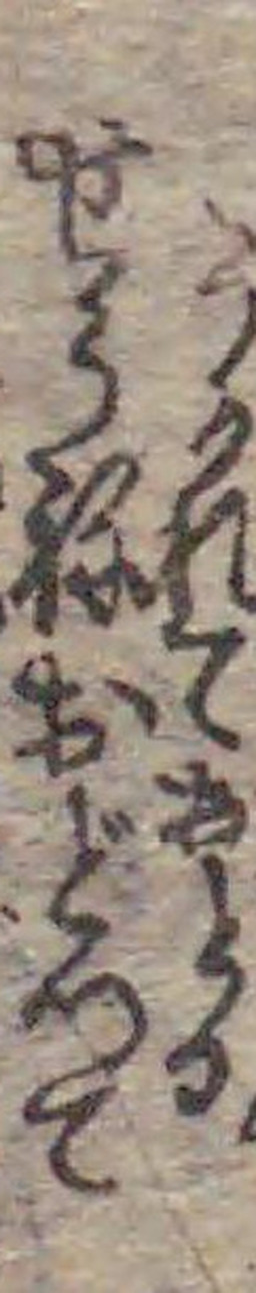せうねおどつて
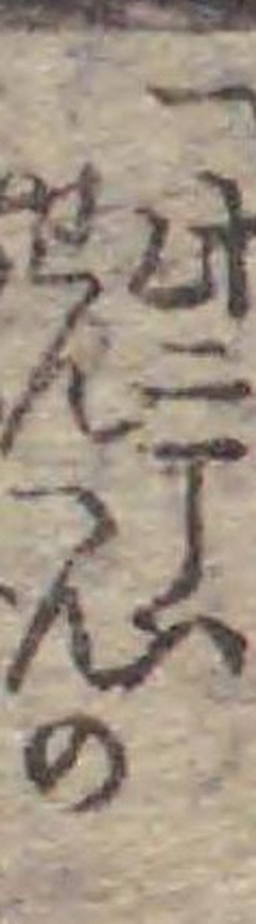せんへんの
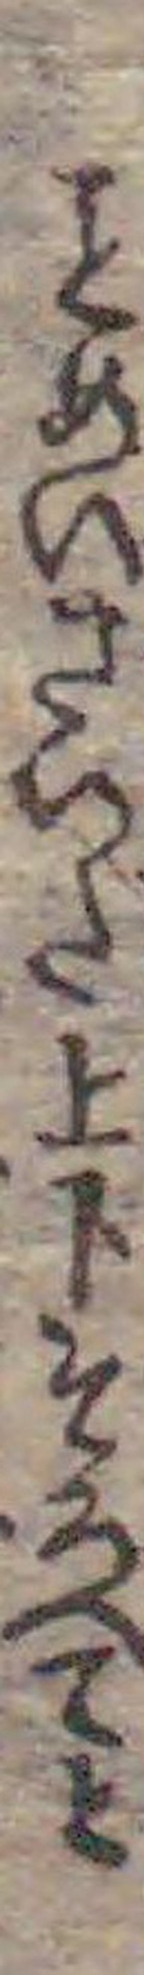ことめいさいだ上下そろへてと
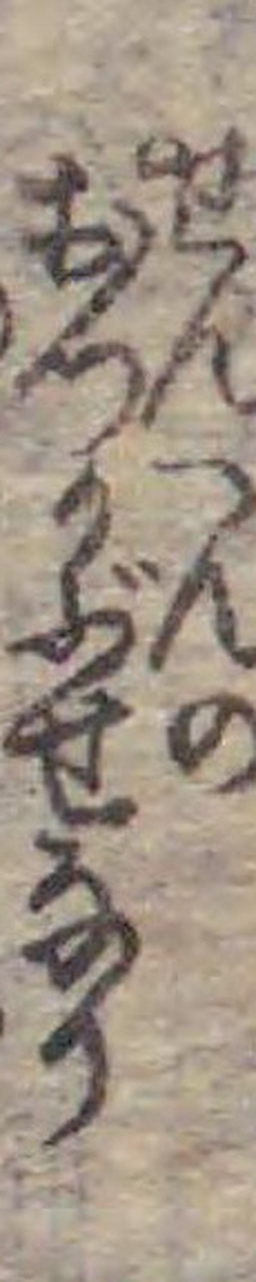おつかぶせなり
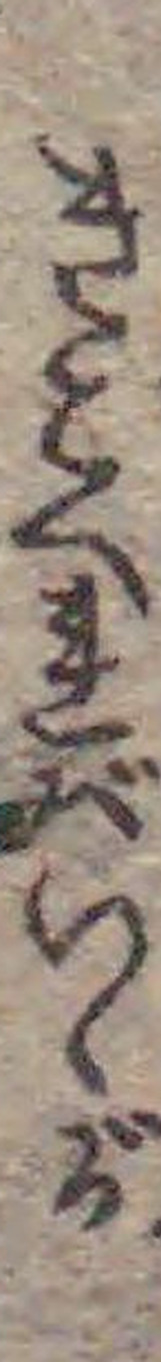きこへればいゝが
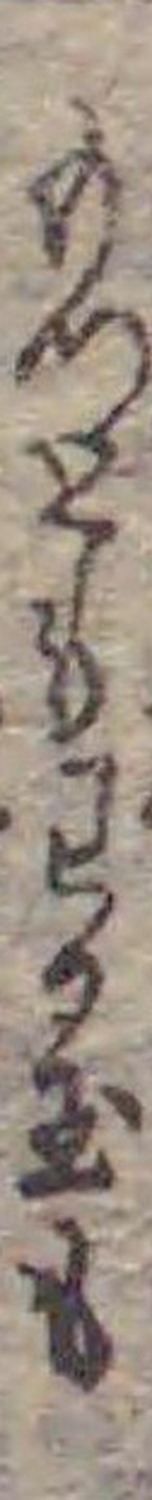もつともわる玉も
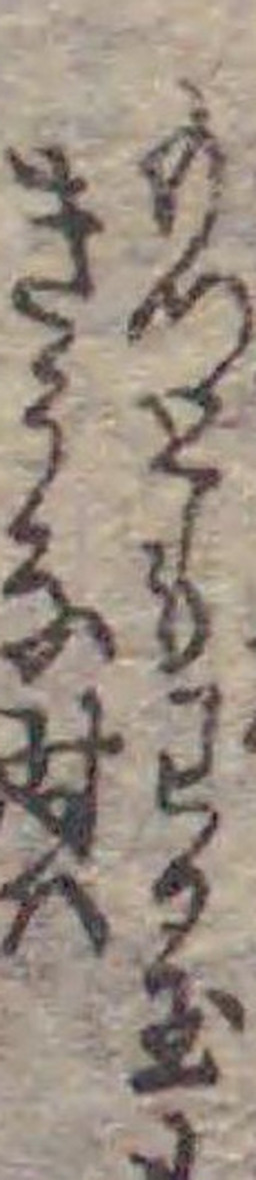きうな時は
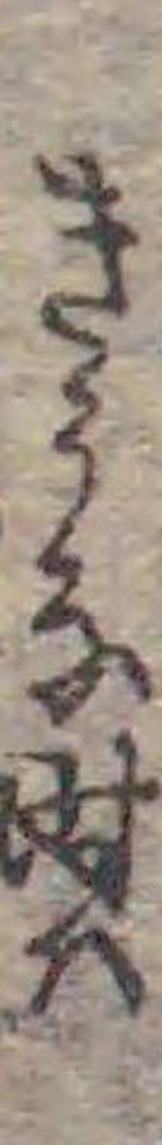きうな時は
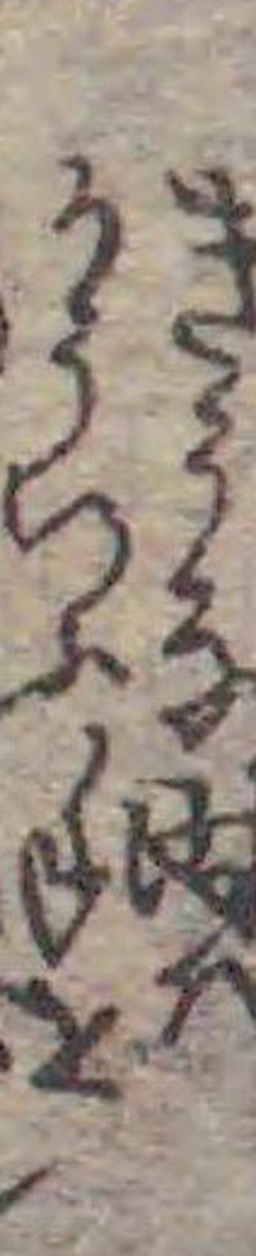かういふ手を
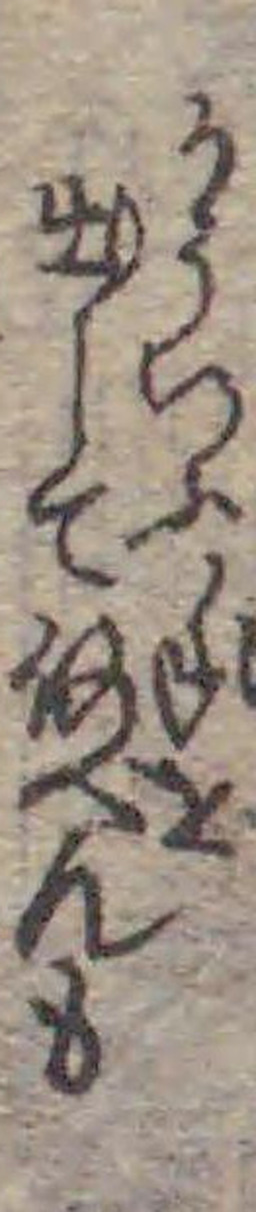出して何へんも
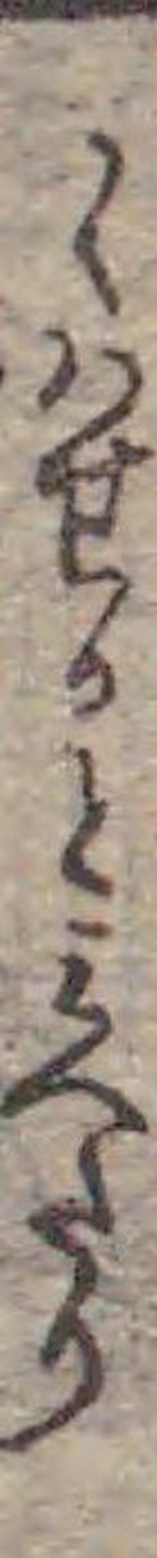くはせるとみへたり
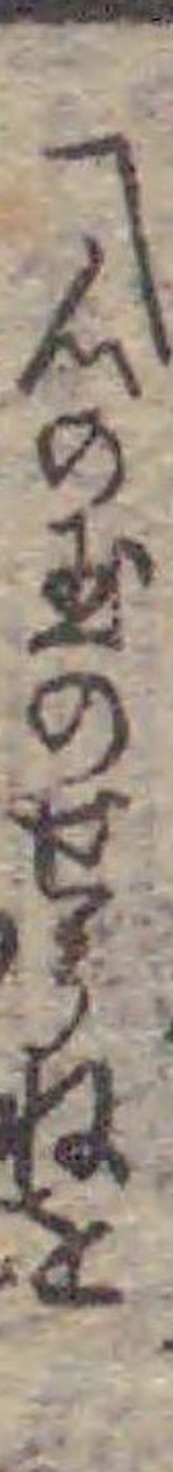〽心の玉のせうねを
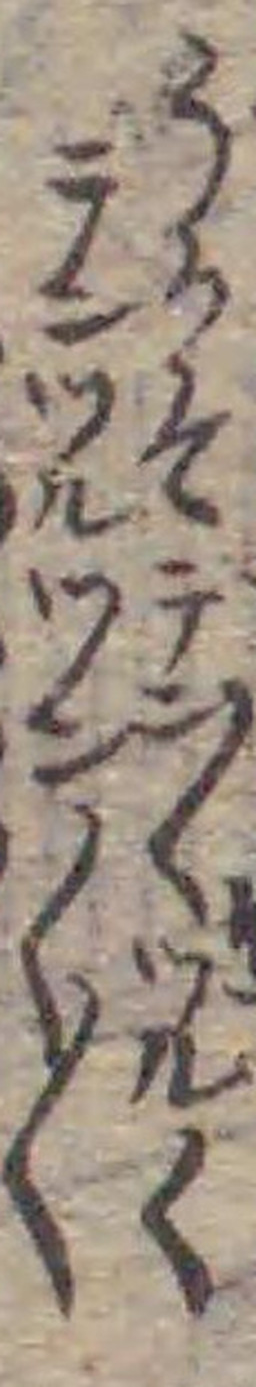テンツルツン〳〵〳〵
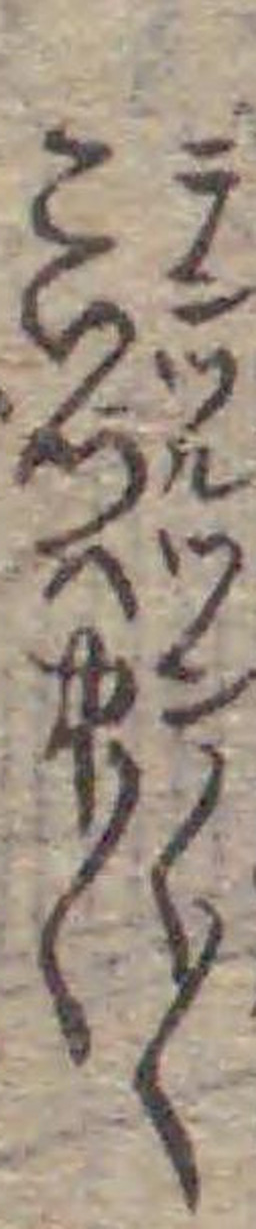こいつは中〳〵
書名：四遍搨心学草帋 : 3巻
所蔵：国立国会図書館 National Diet Library, JAPAN
